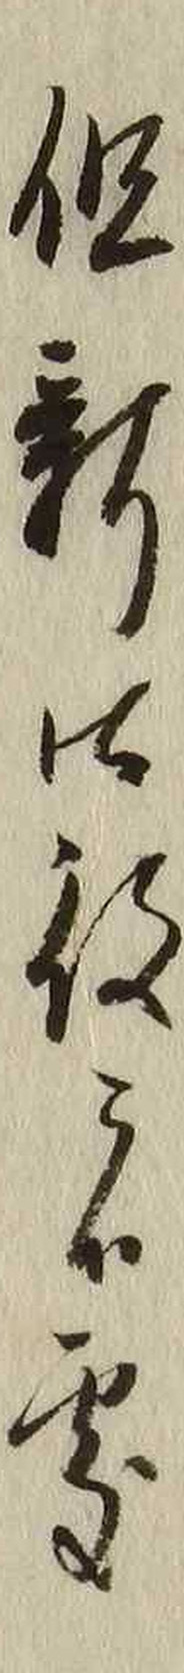但新御役ニ候処
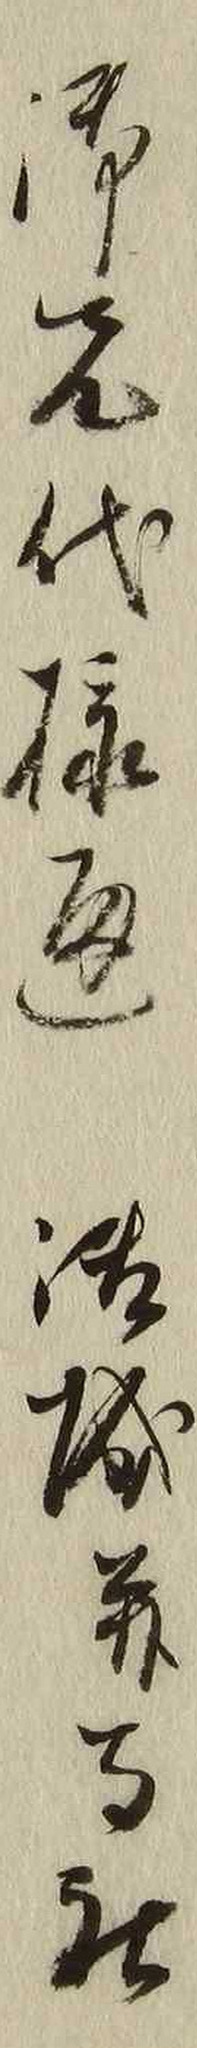御先代様通御城并寺社
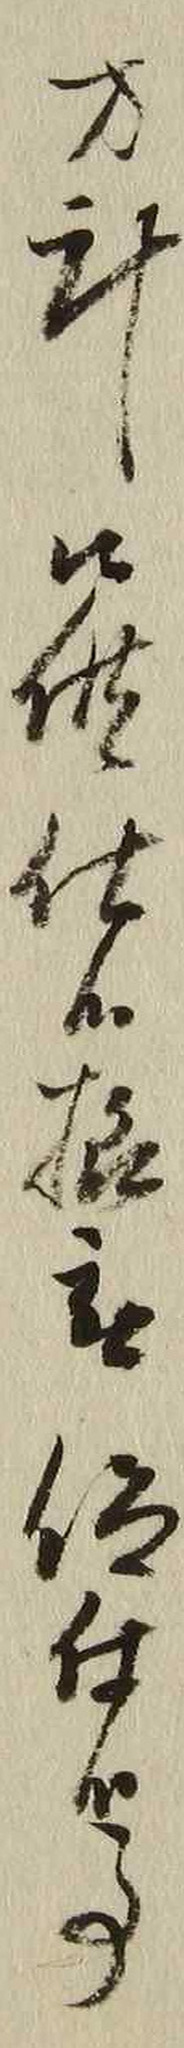方計御供仕候様被仰付候事
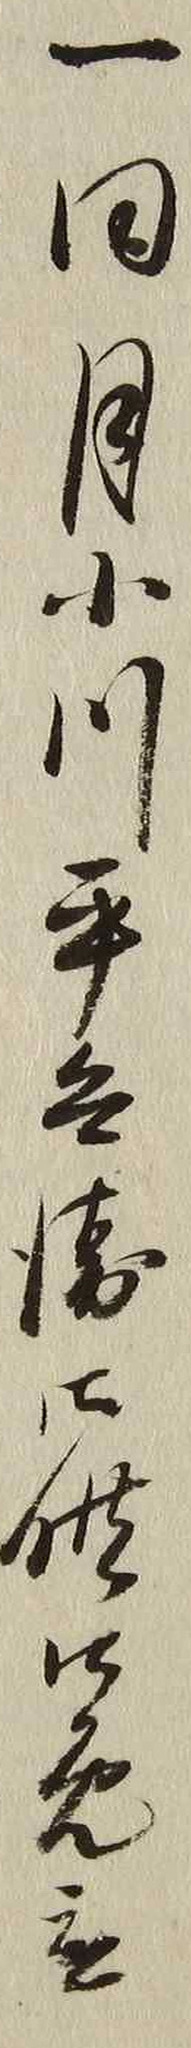一同月小川平兵衛御供御免被
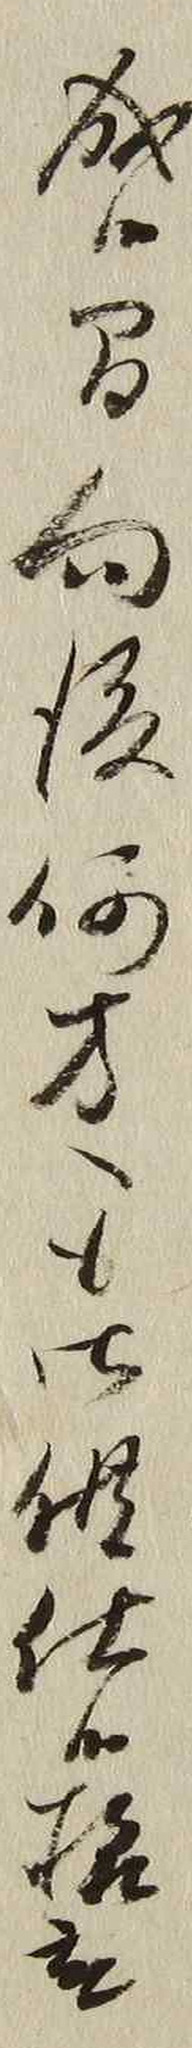成候間向後何方へも御供仕候様被
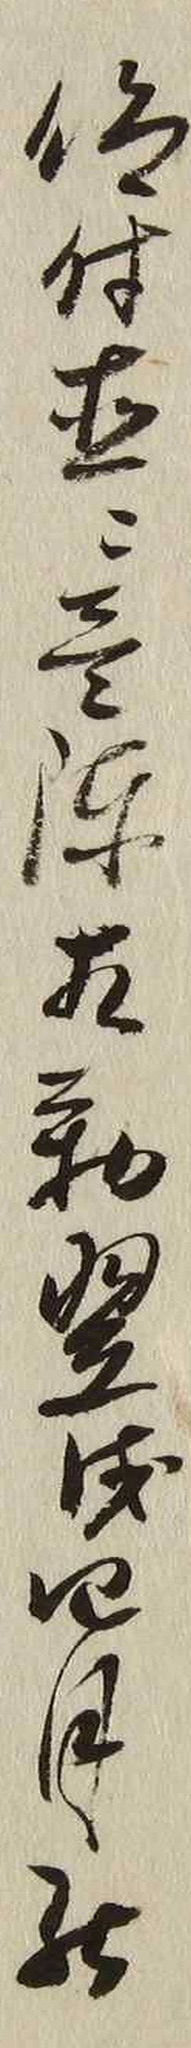仰付直ニ壱陣相勤翌戌四月罷
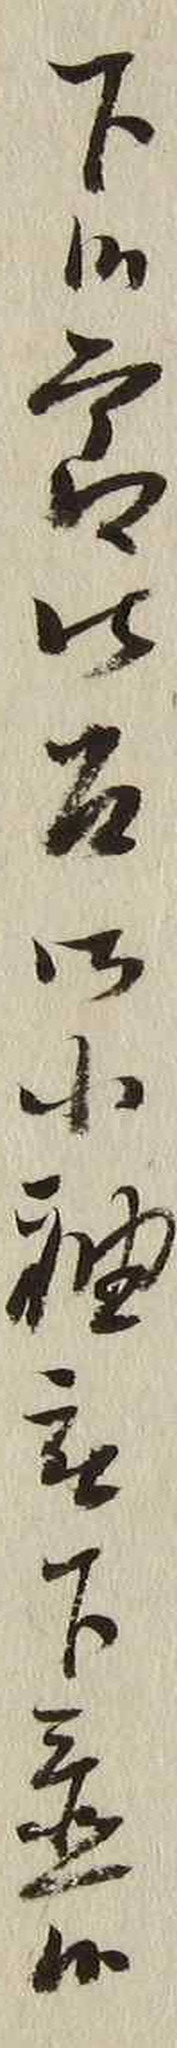下候節御召御小袖被下置候
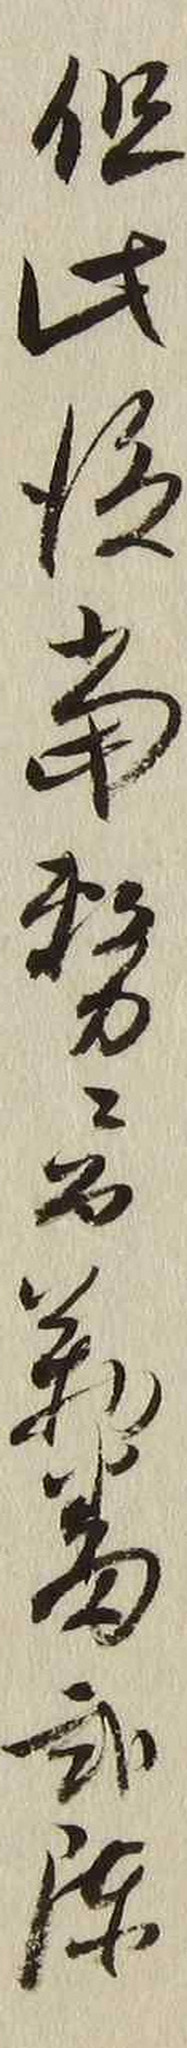但此後当務ニ而勤番弐陣
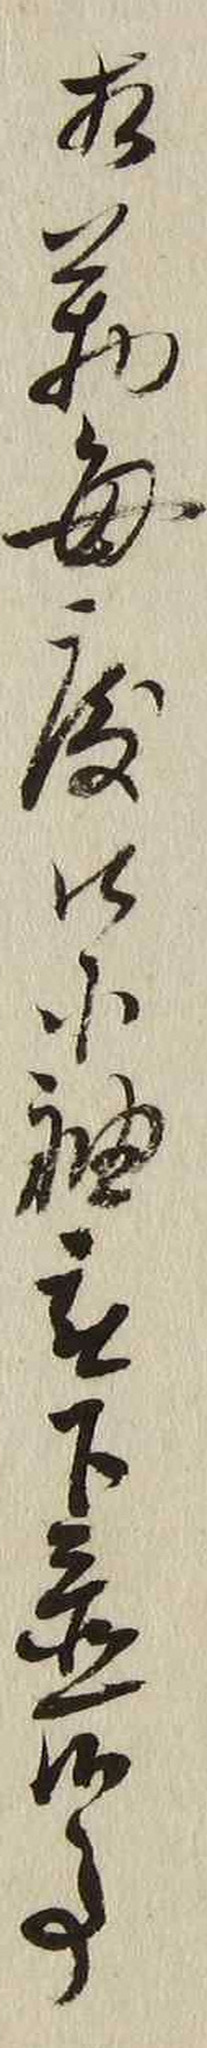相勤毎度御小袖被下置候事
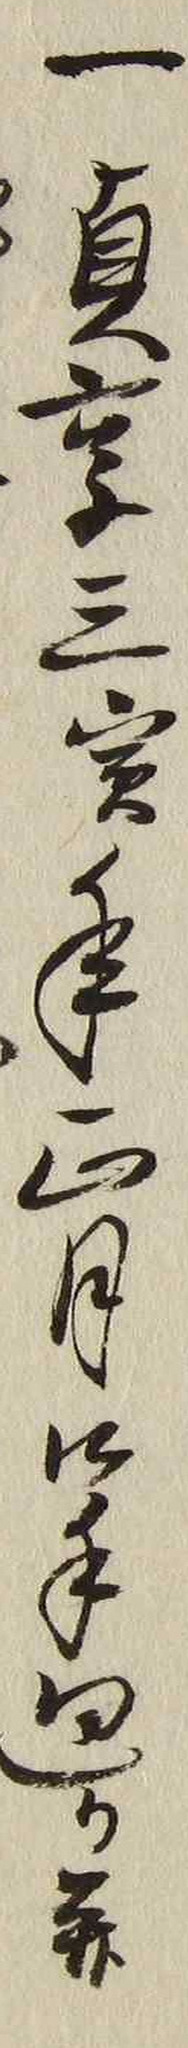一貞享三寅年正月御手廻り并
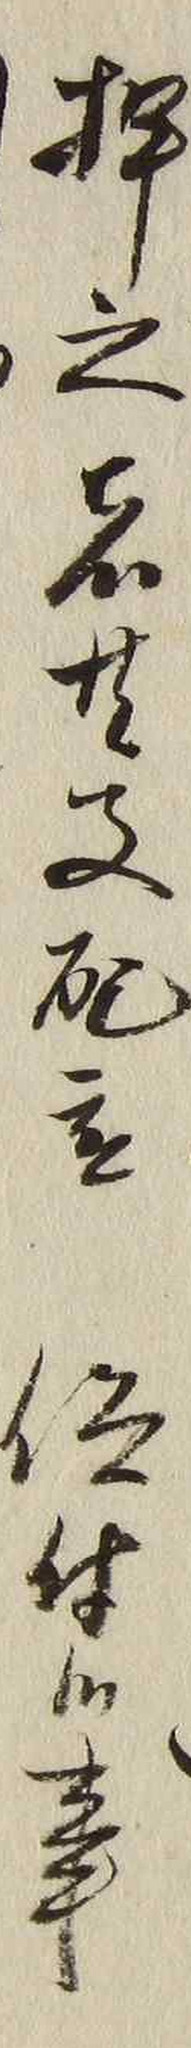掉之者共支配被仰付候事
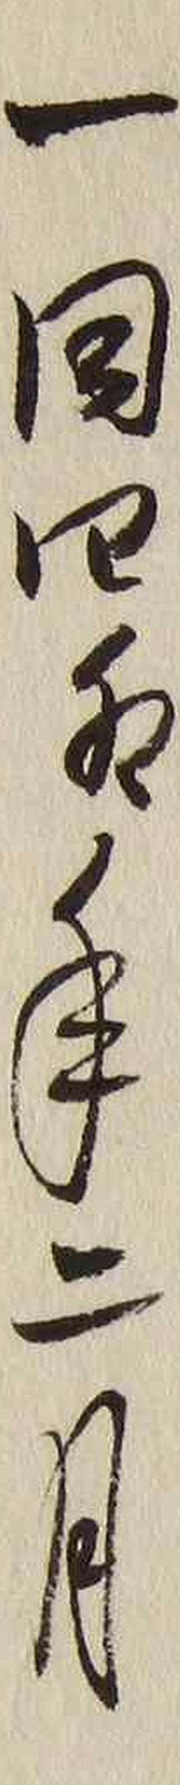一同四卯年二月
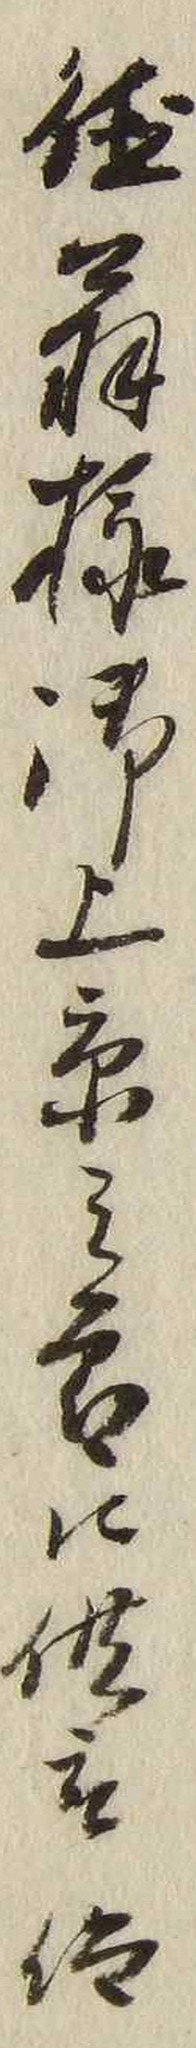徳翁様御上京之節御供被仰

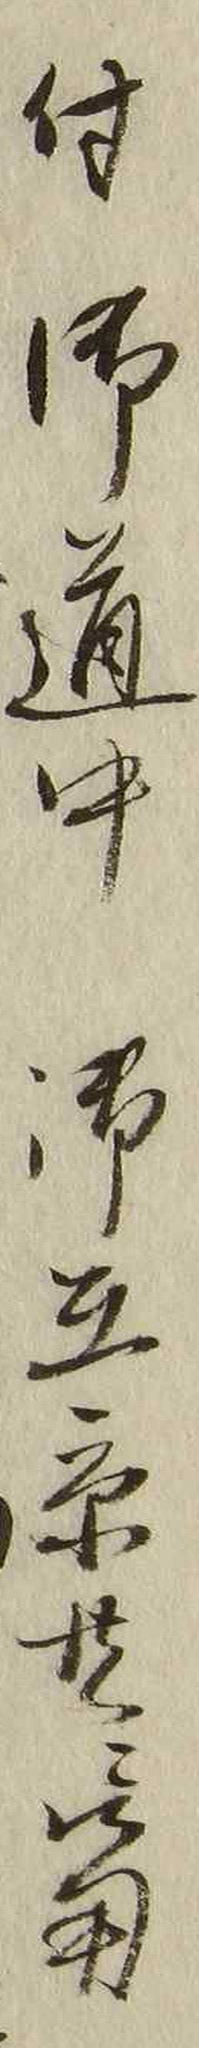付御道中御在京共ニ御用
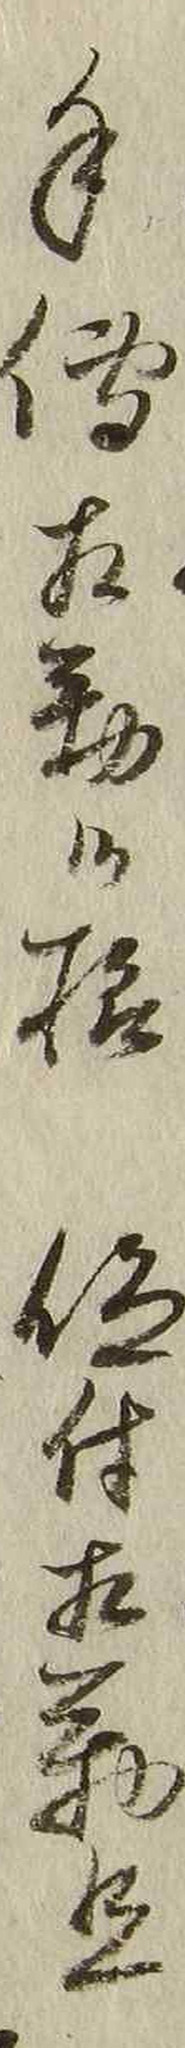手伝相勤候様仰付相勤且
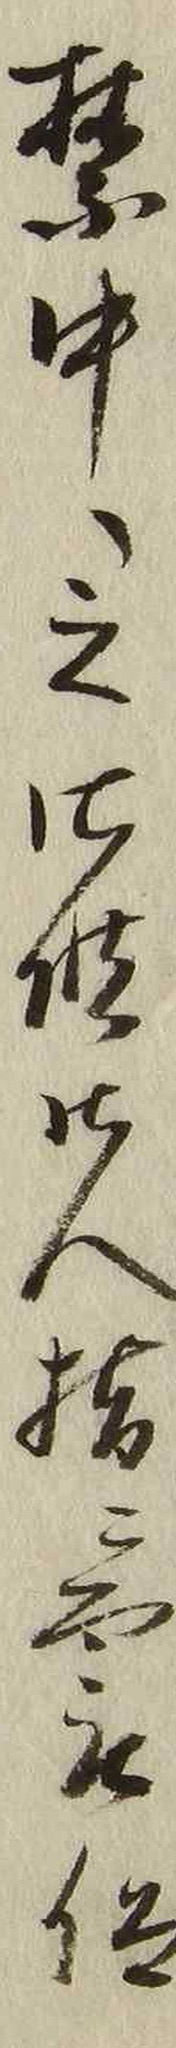禁中へ之御供御人指ニ而被仰
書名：諸士系譜　巻之355　す之部5
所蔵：会津若松市立会津図書館
